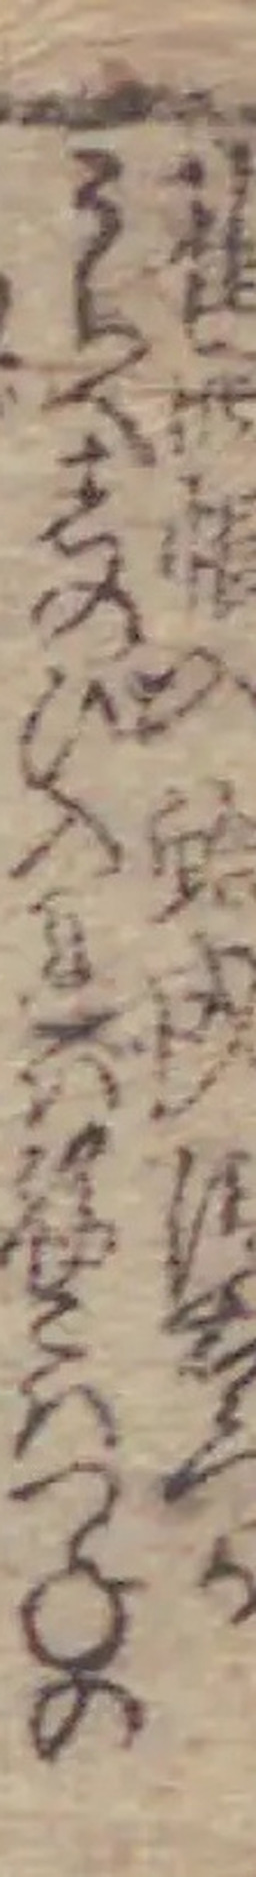うちへしのび入ればねこはつねの
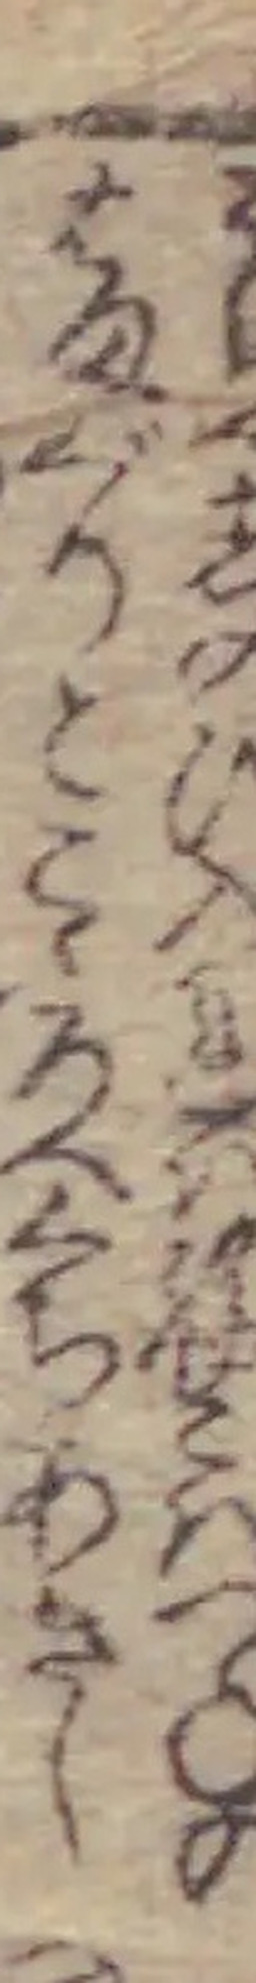はまぐりとこゝろへくちあきし
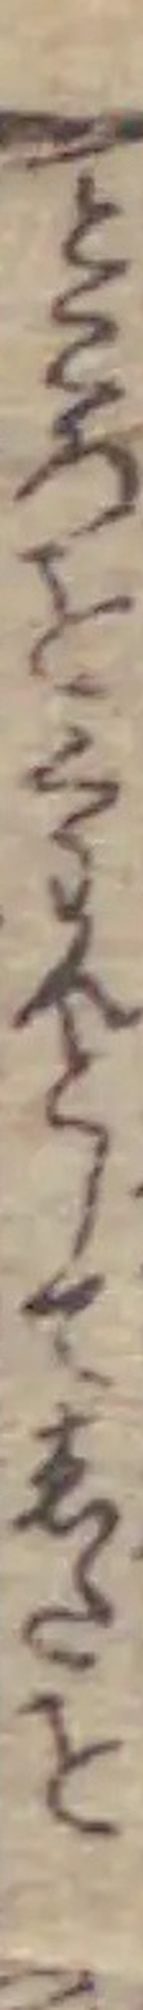ところをくわんとしてしたを
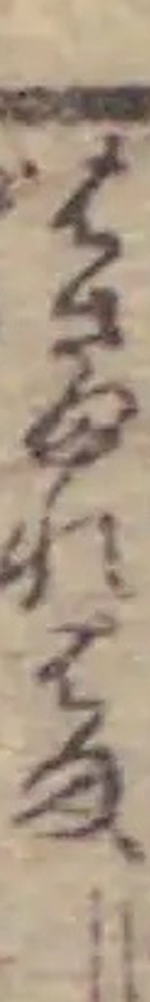はさまれはま
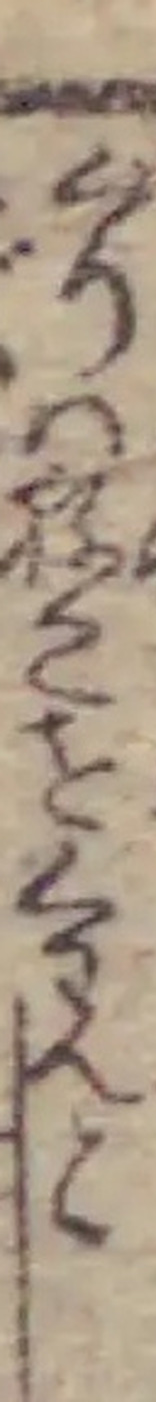ぐりはねこをくわんと
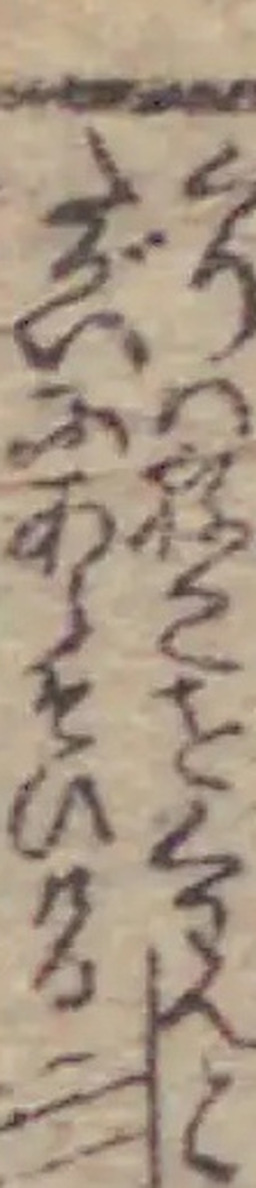たがいにあらそいける
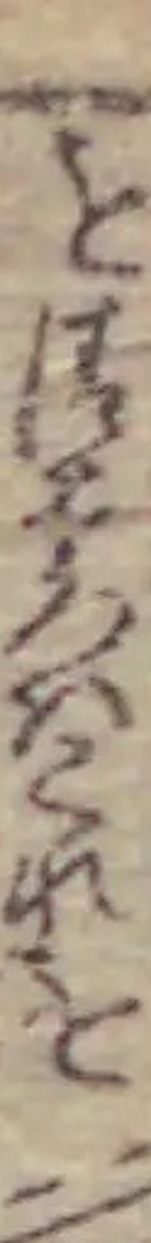を清右エ門はこれを
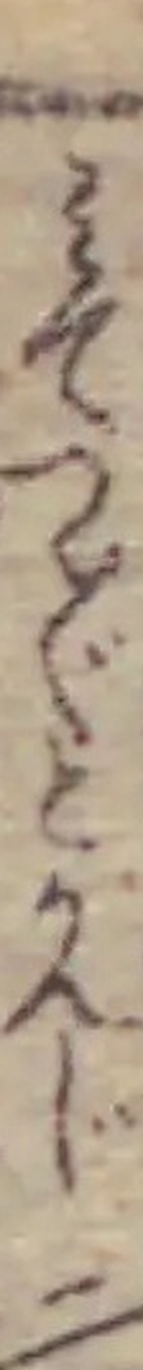みてつく〴〵とかんじ
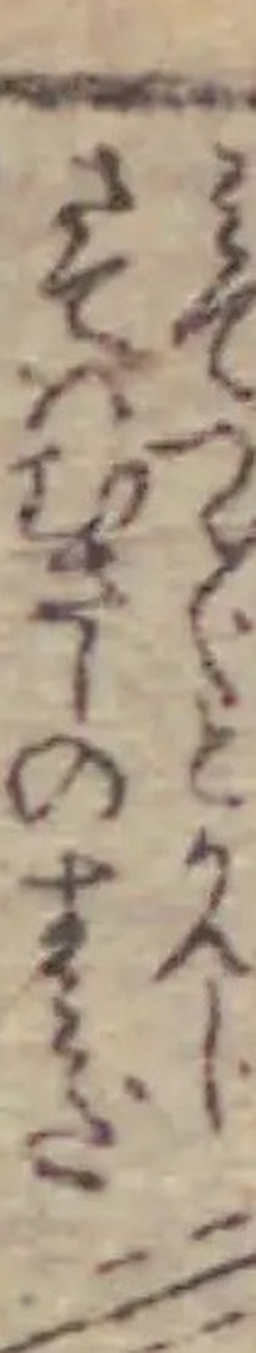さてはむさしのすみだ
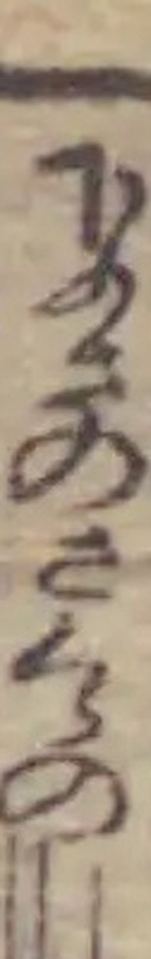下ふさのさくらの
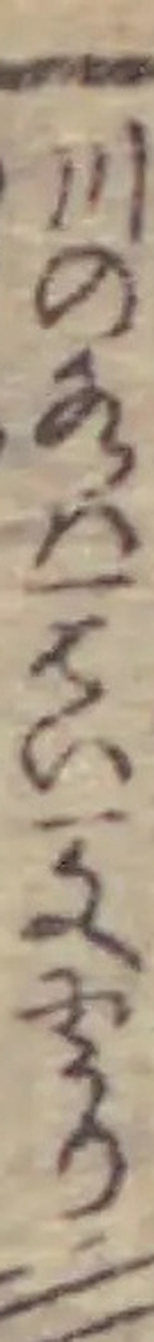川の水は一はい一文にうり
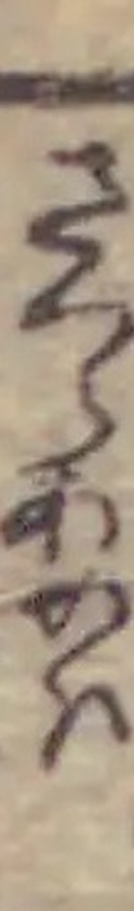さくらあめは
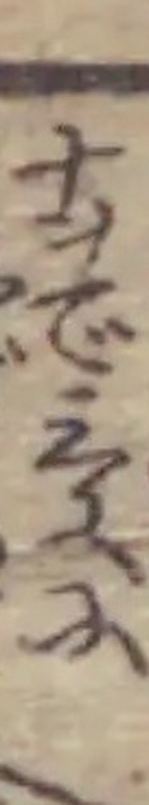十斗で三文に
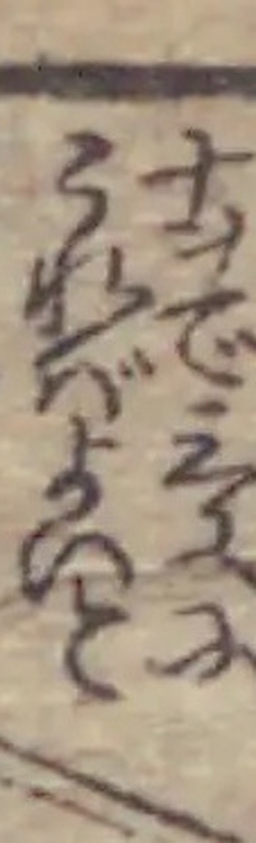うればよいと
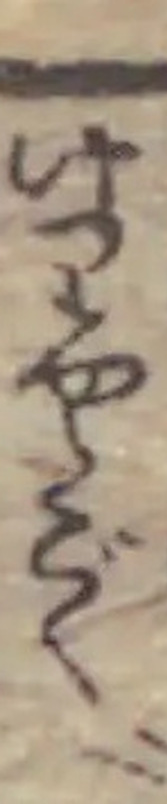此りやうごく
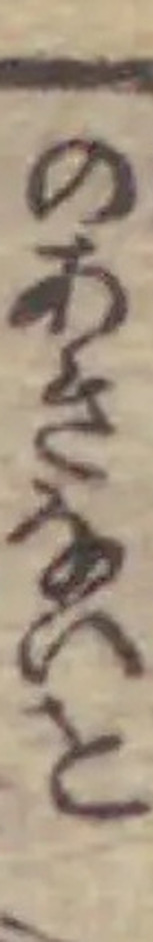のあきないを
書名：冷水灰毛猫 2巻
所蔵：国立国会図書館 National Diet Library, JAPAN
